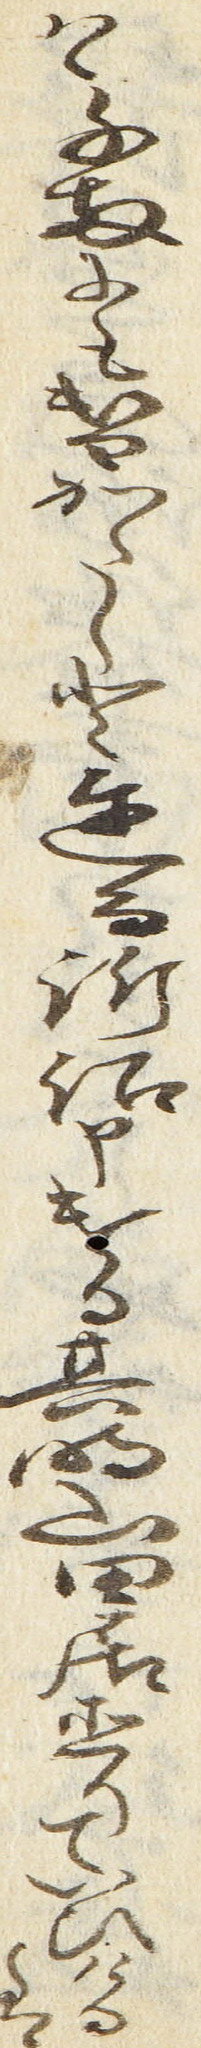はゝ千両にも替かたしと達而訴訟申ける其時山田居直りていひけるは

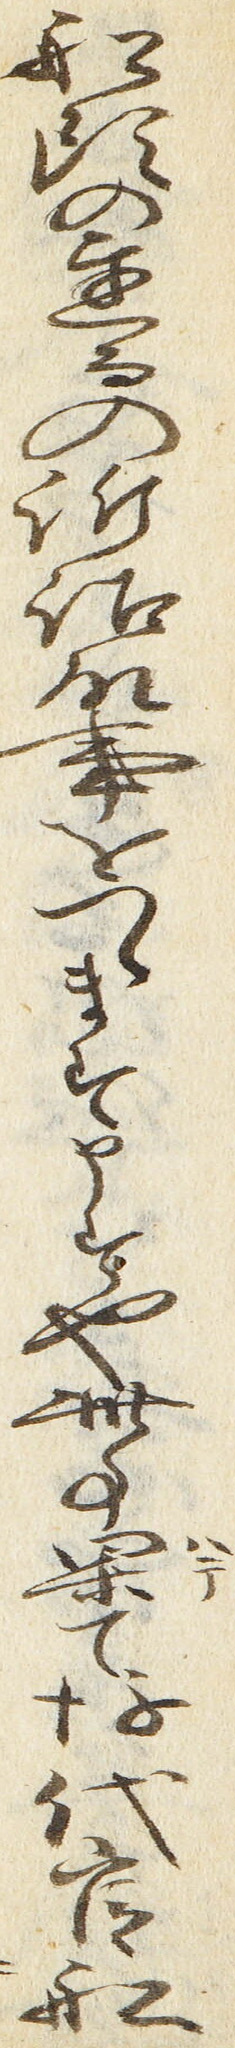船頭の達而の訴訟故事をつゝます申す也此事果て後代官船
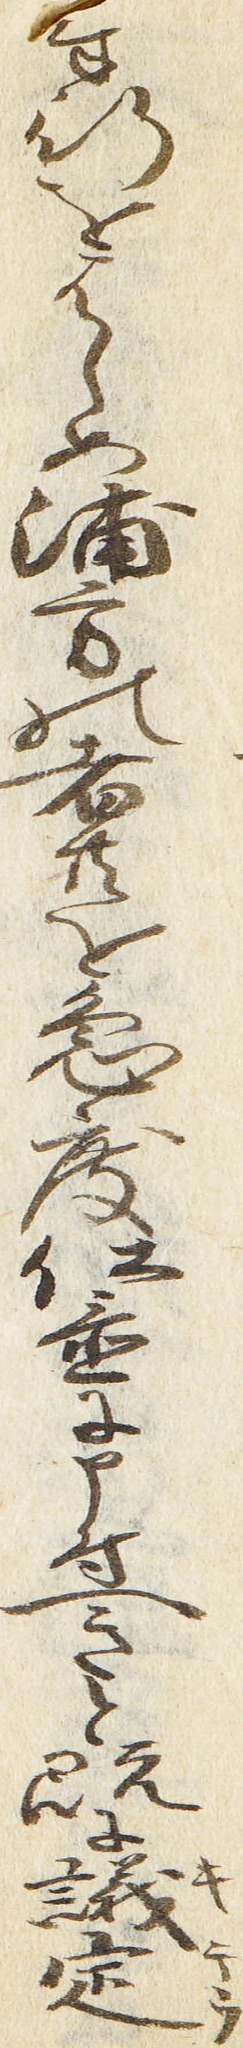奉行をはしめ浦方の者共を急度仕置に申付へきと既に議定
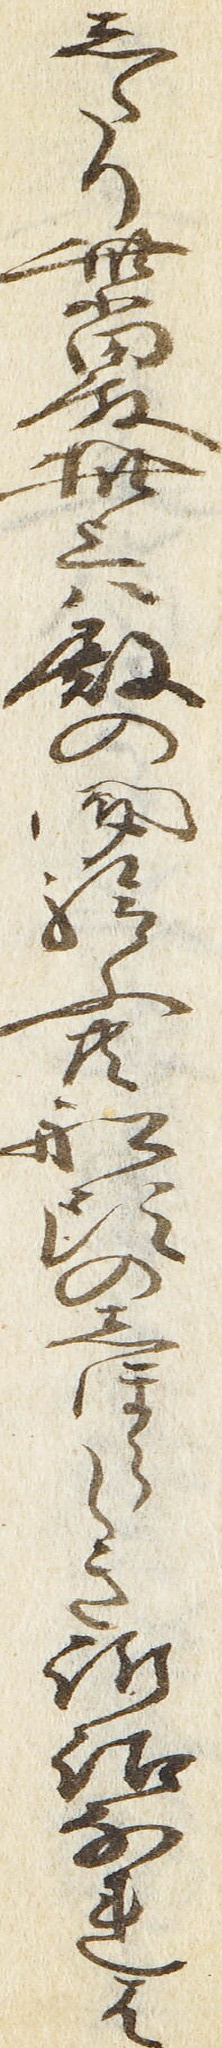したり柴田殿此上は殿の聞給ふ共船頭のしほらしき訴訟なれは
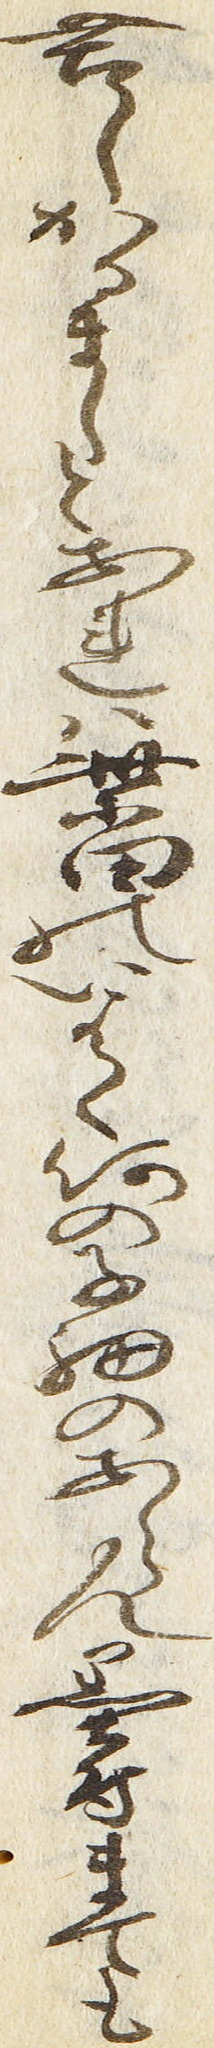苦しかるましとあれは柴田のいはく何の子細のあらん墨付まても
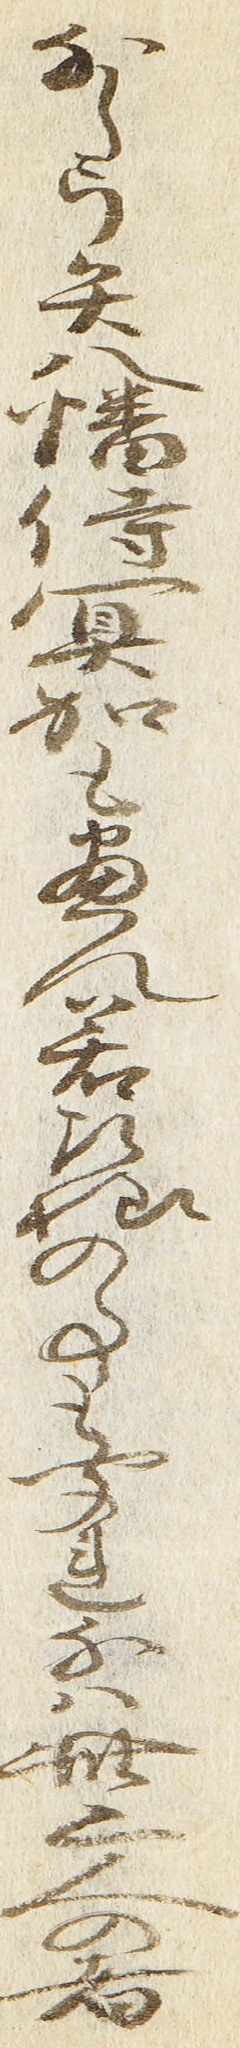なし弓矢八幡侍冥加も尽ん若左様の事も聞れなは此二人の者
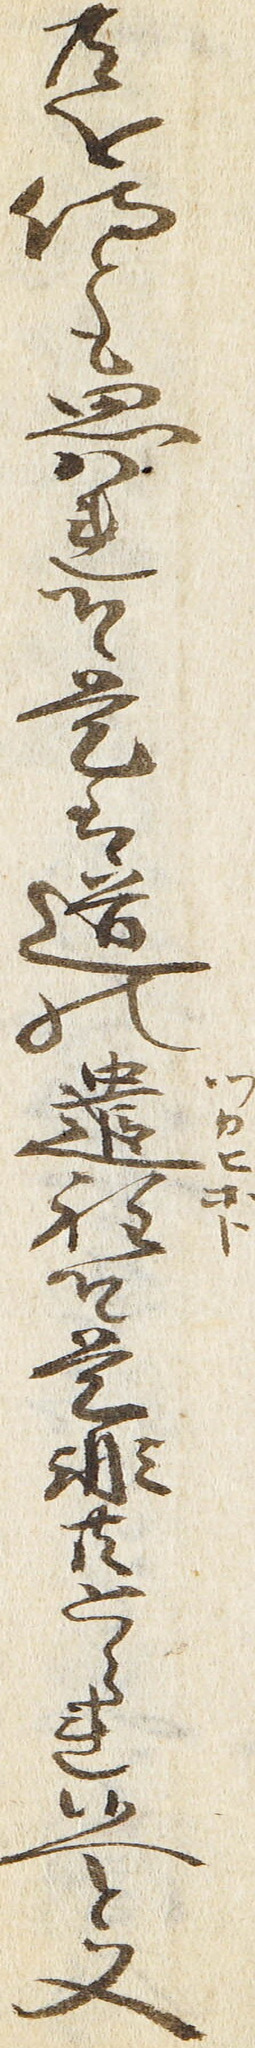共を侍とも思はれそ是は道の遣程そ是非共とられ候へと又
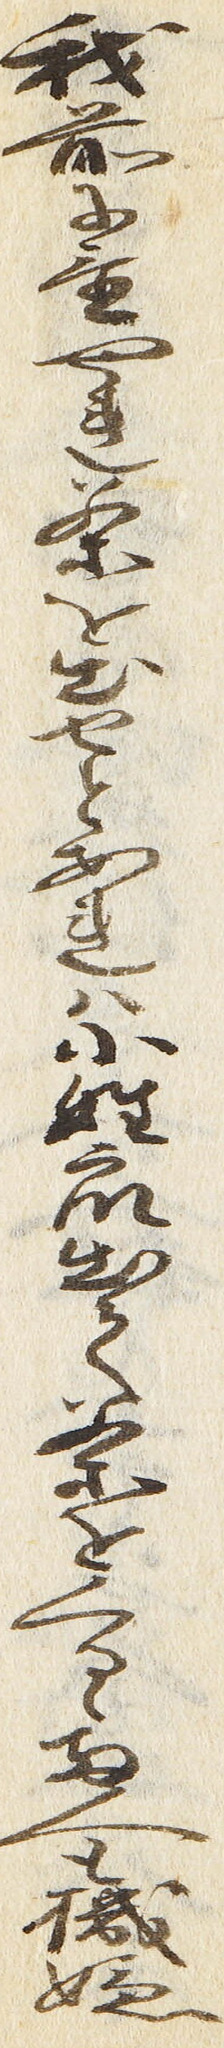我前に置やれ茶を出せとあれは小姓衆出て茶をくるゝ両人も機嫌
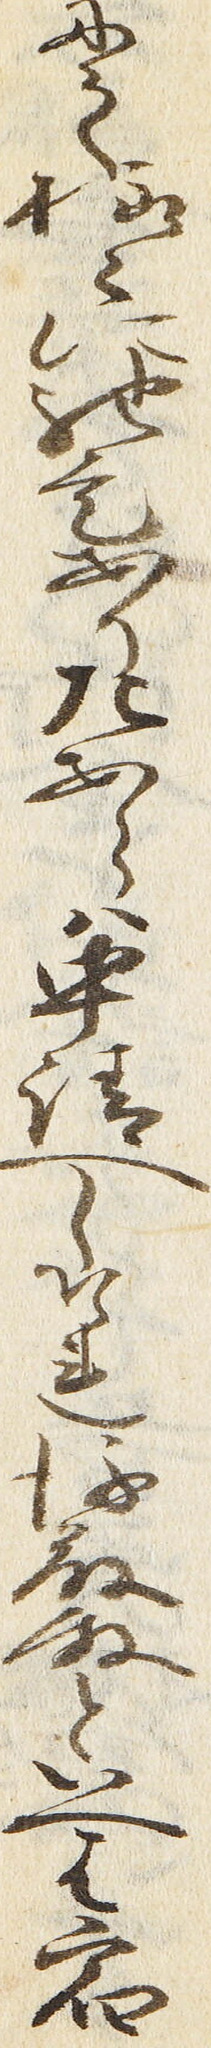にて様々に馳走あり左あらは申請へしそれ後藤殿といへは宿
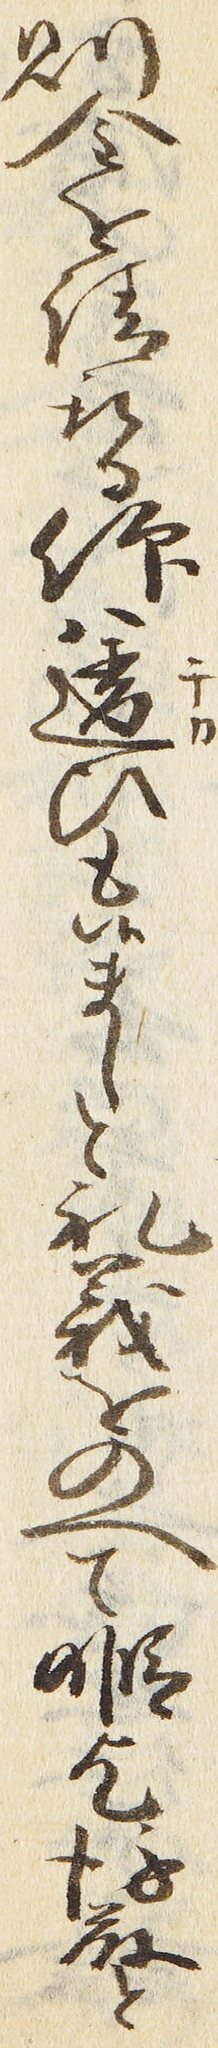則金を請取る仰は違ひも候ましと礼義をのへて暇乞後藤と
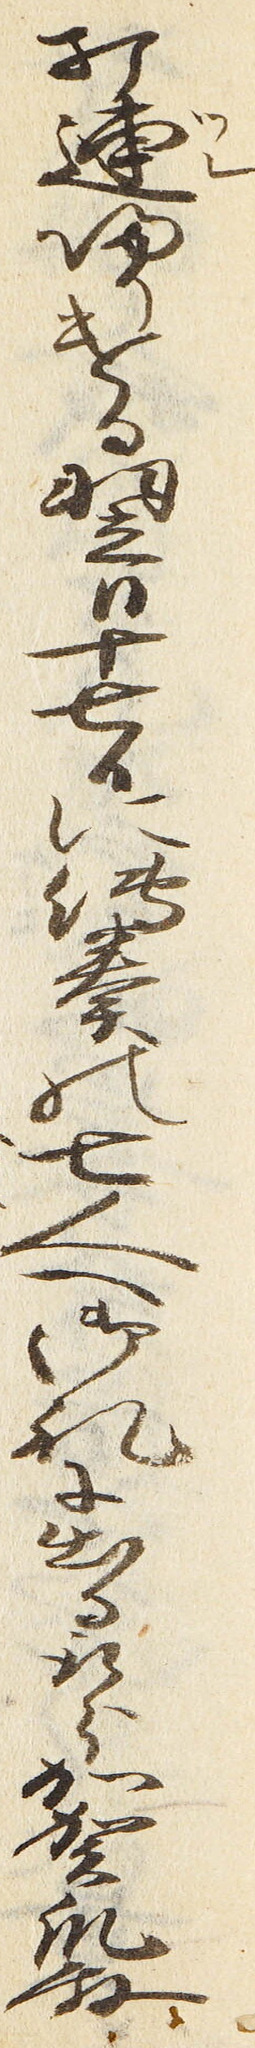打連帰りける翌日十七日に伝奏の七人へ御礼に出る取分加賀爪殿
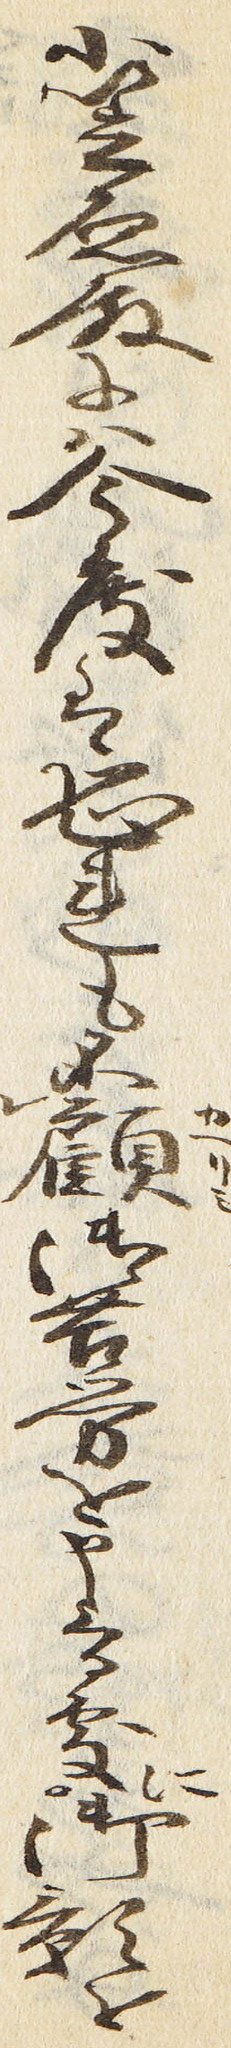小笠原殿には今度は恐れも不顧御苦労を申上る処に御影を
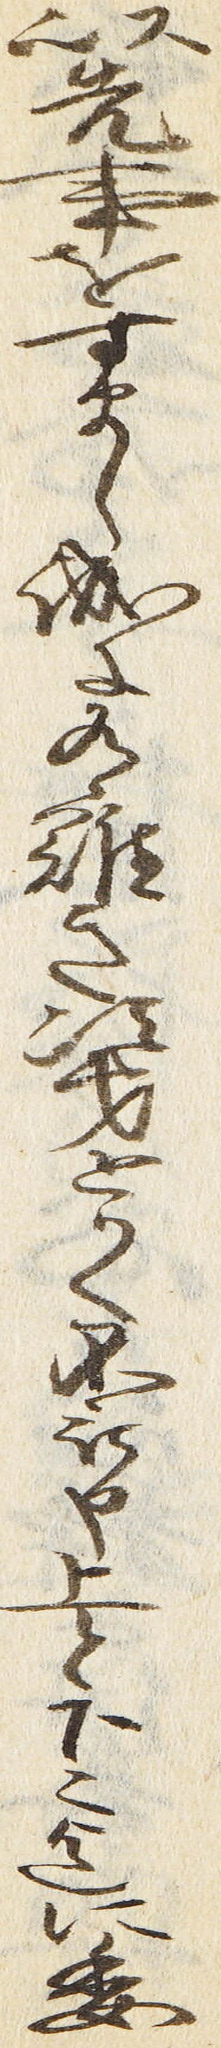以先事をすまし誠に有難き次第とかく不被申上と下々迄に委
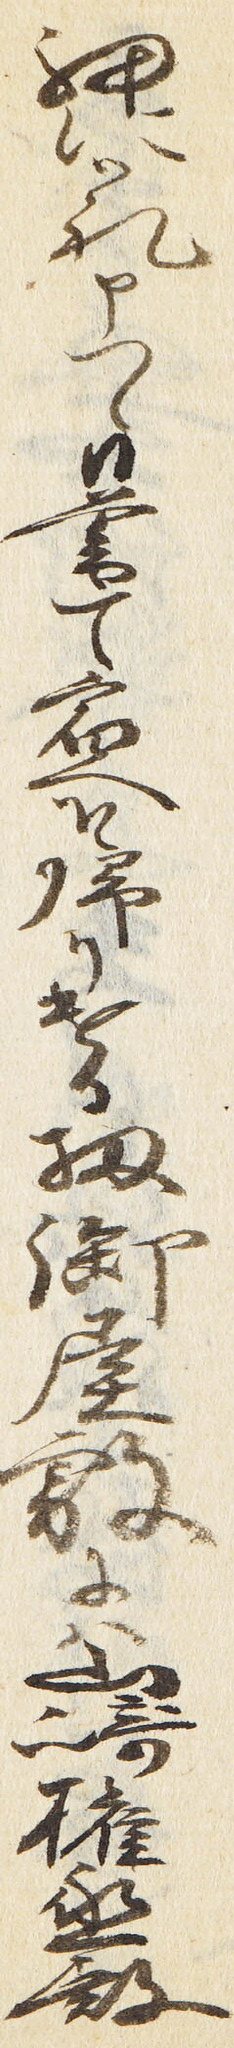細に御礼申つゝ日暮て宿へそ帰りける扨御屋敷には山崎権丞殿
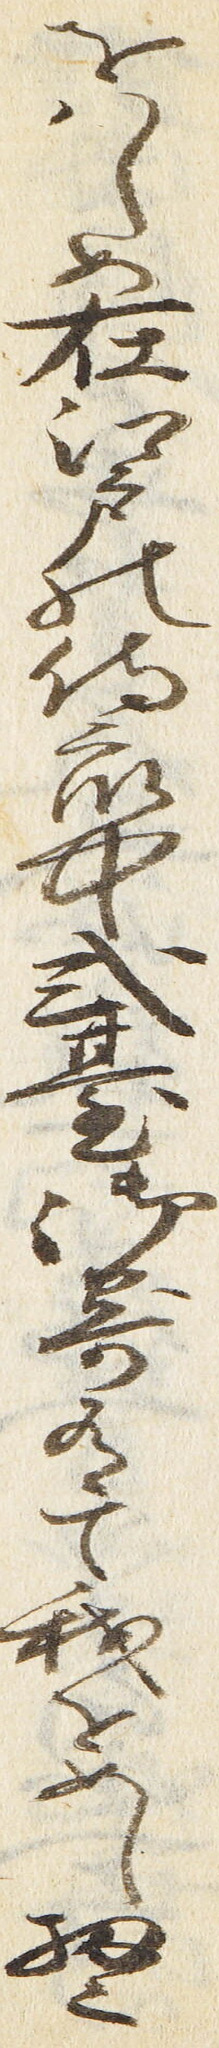をはしめ在江戸の侍衆中式台御寄有て我をめし扨々
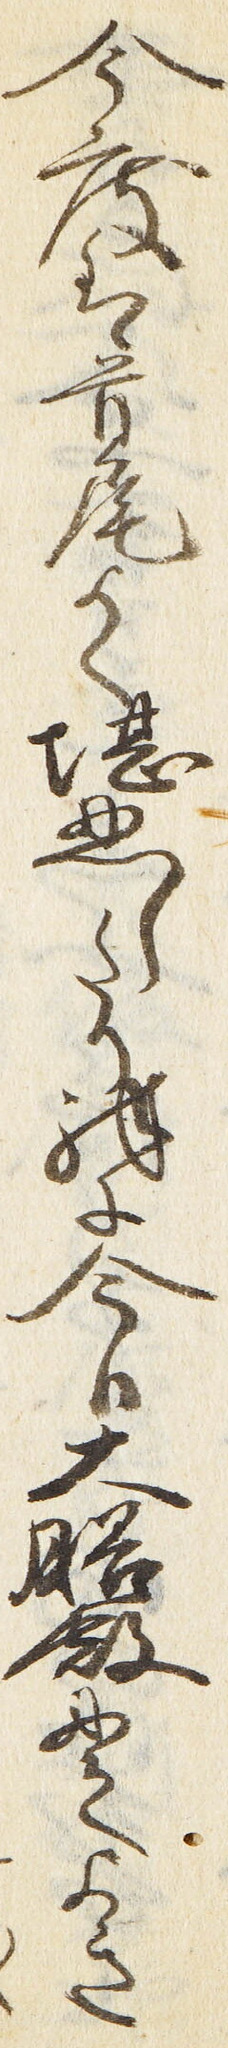今度は首尾よく堪忍したり誠に今日大膳殿にてよき
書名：海陸世話日記
